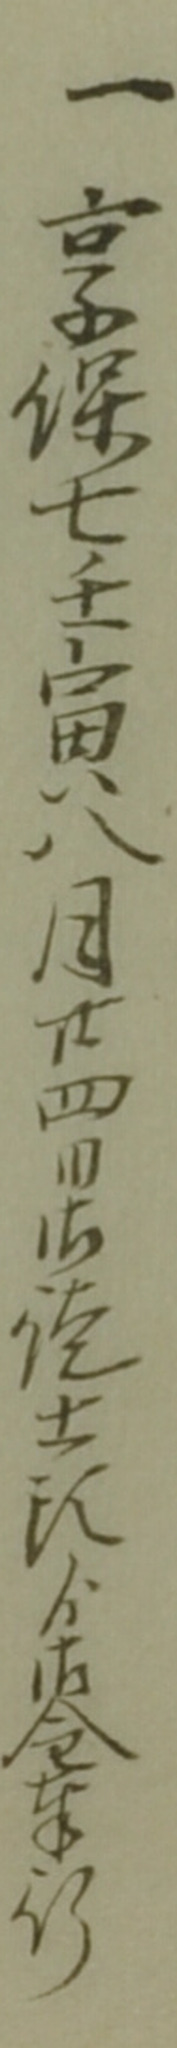一享保七壬寅八月廿四日御徒士頭ゟ御金奉行
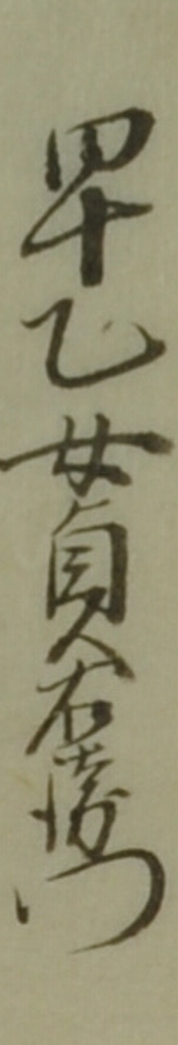早乙女貞右衛門
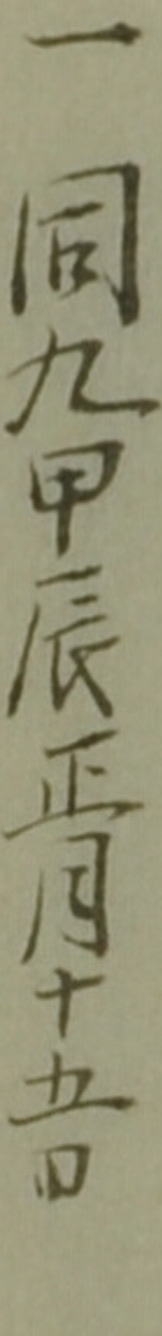一同九甲辰正月十五日
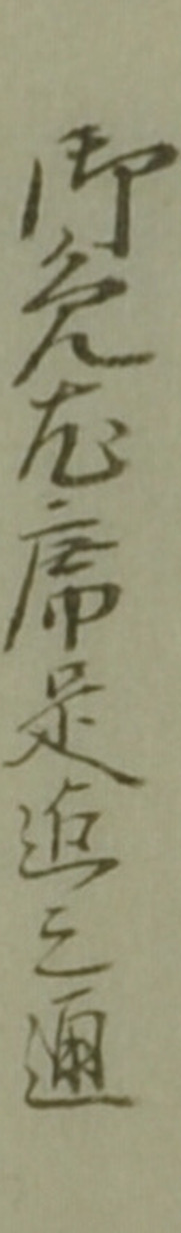御免尤席是迄之通
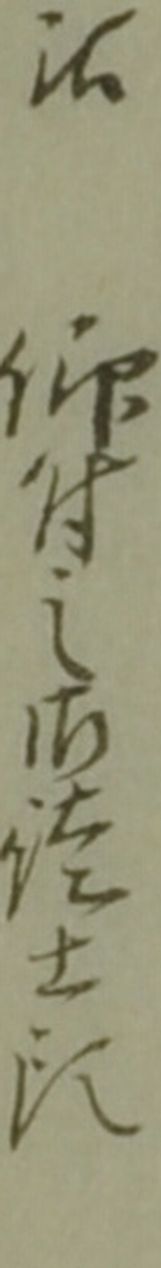被仰付之御徒士頭
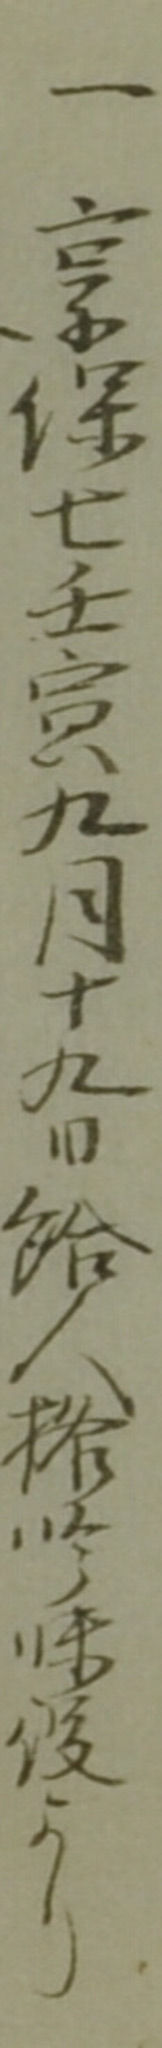一享保七壬寅九月十九日給人格吟味役より
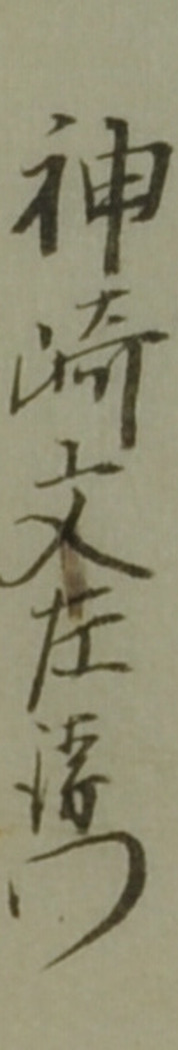神崎文左衛門
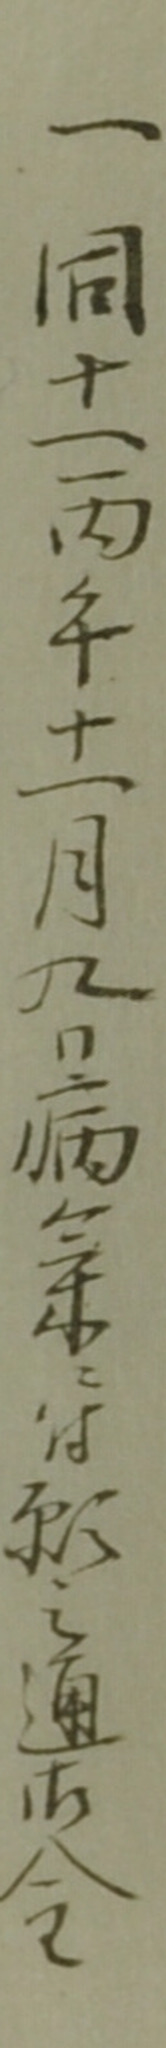一同十一丙午十一月九日病気付願之通御金
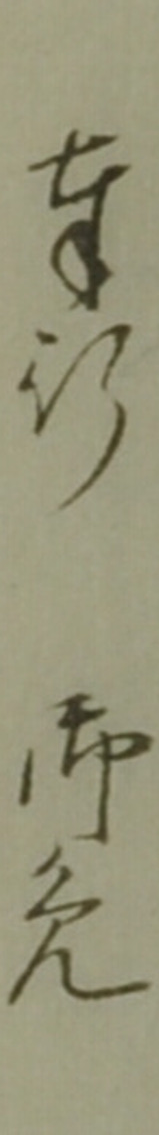奉行御免
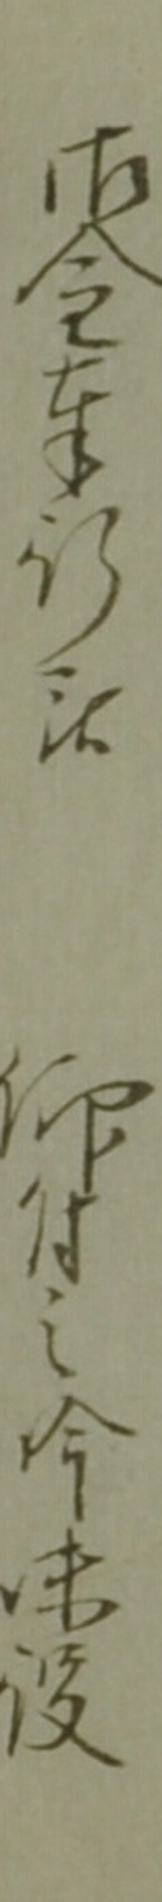御金奉行被仰付之吟味役

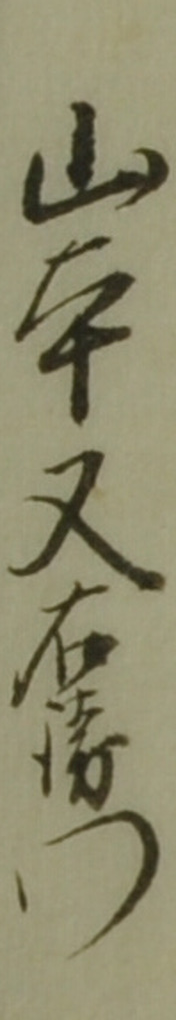山本又右衛門
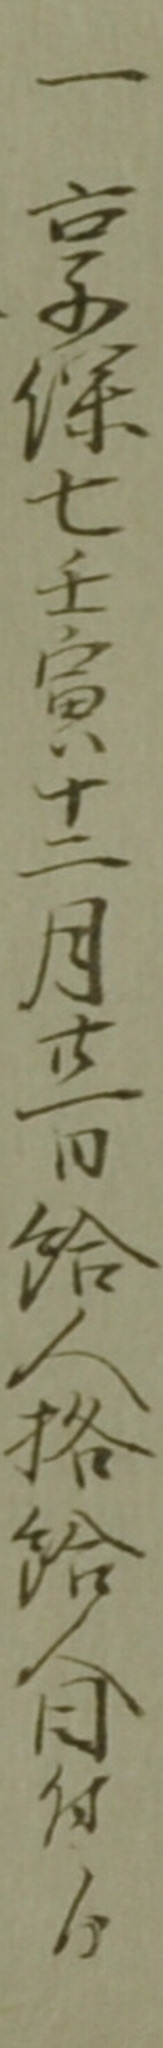一享保七壬寅十二月廿一日給人格給人目付ゟ
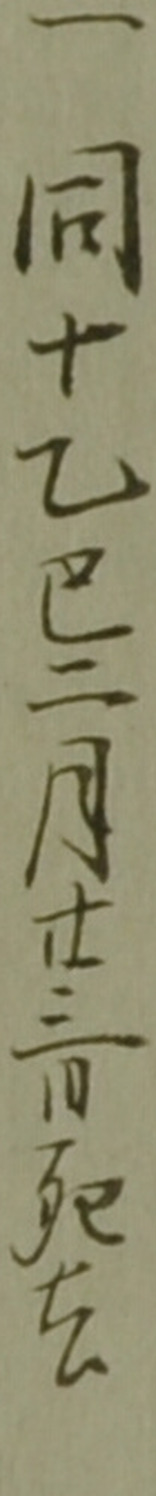一同十乙巳二月廿三日死去
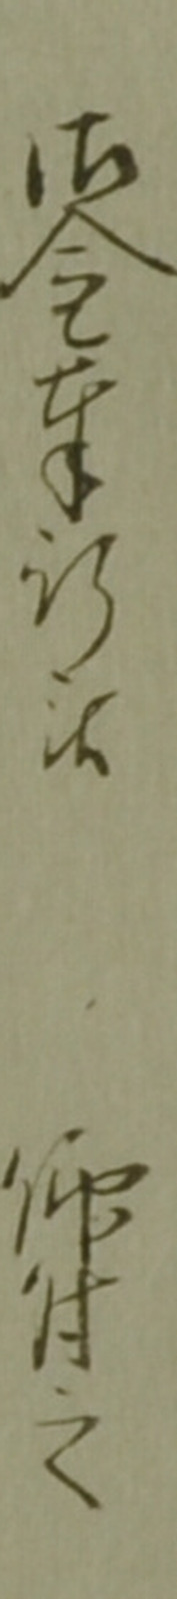御金奉行被仰付之
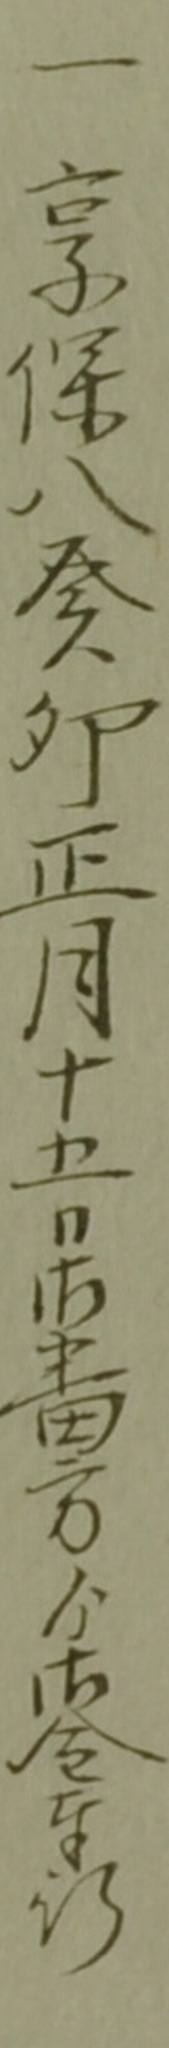一享保八癸卯正月十五日御番方ゟ御金奉行
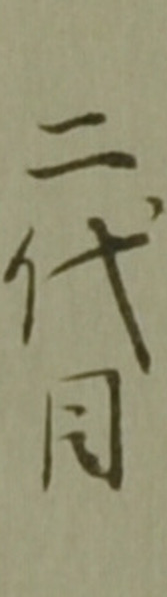二代目
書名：諸御役代々録（七）
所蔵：伊那市立高遠町図書館・合同会社AMANE
